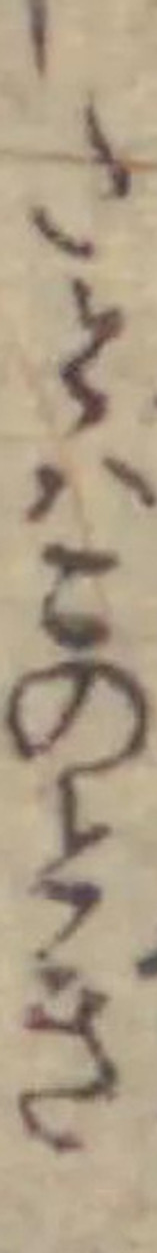たとはこのとき
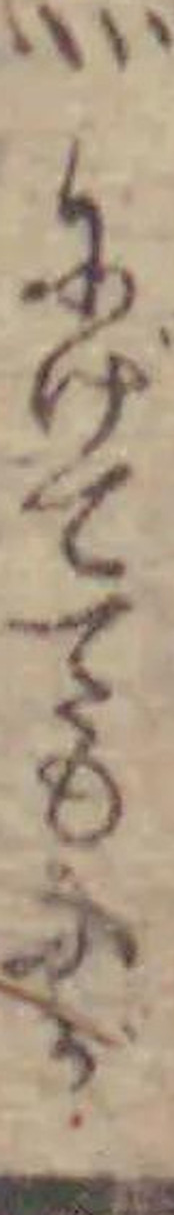にげててもにが
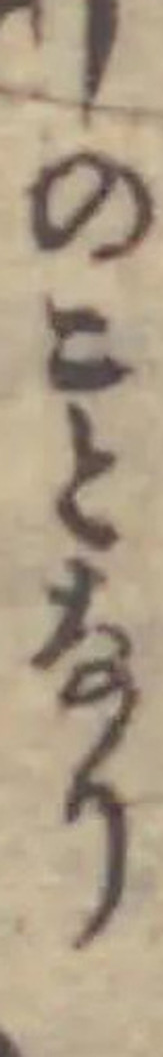のことなり
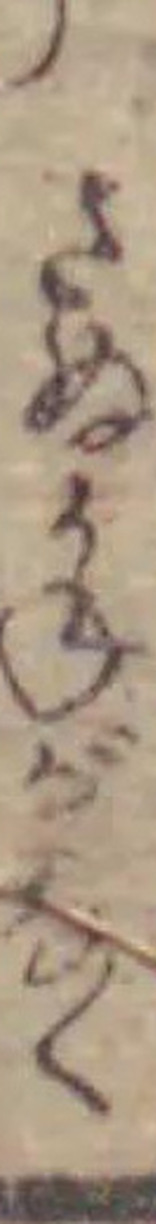さぬかねがなく
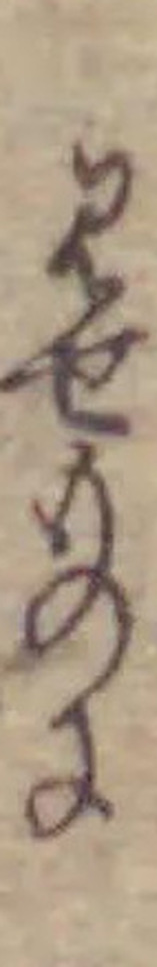みせものに
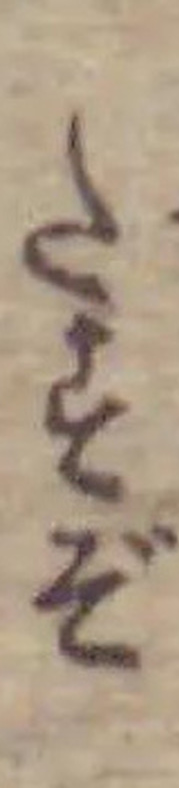たすぞ

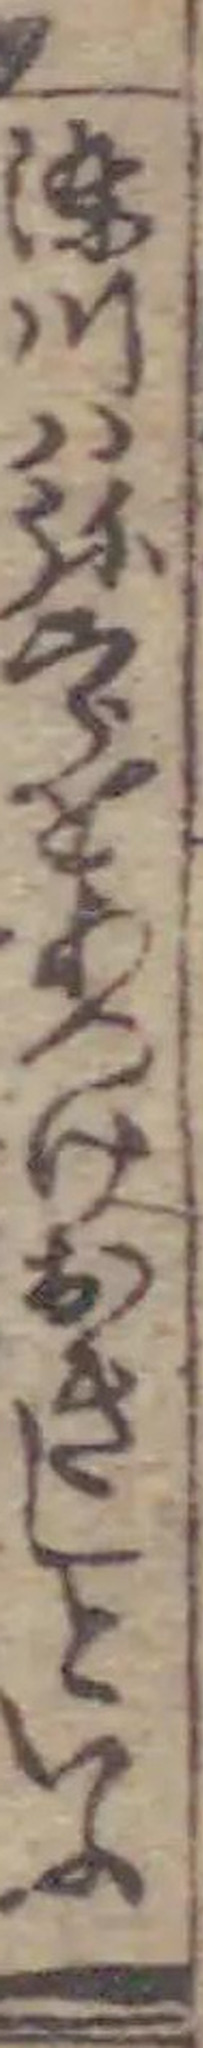染川は弥二郎をあつけおきしといふ
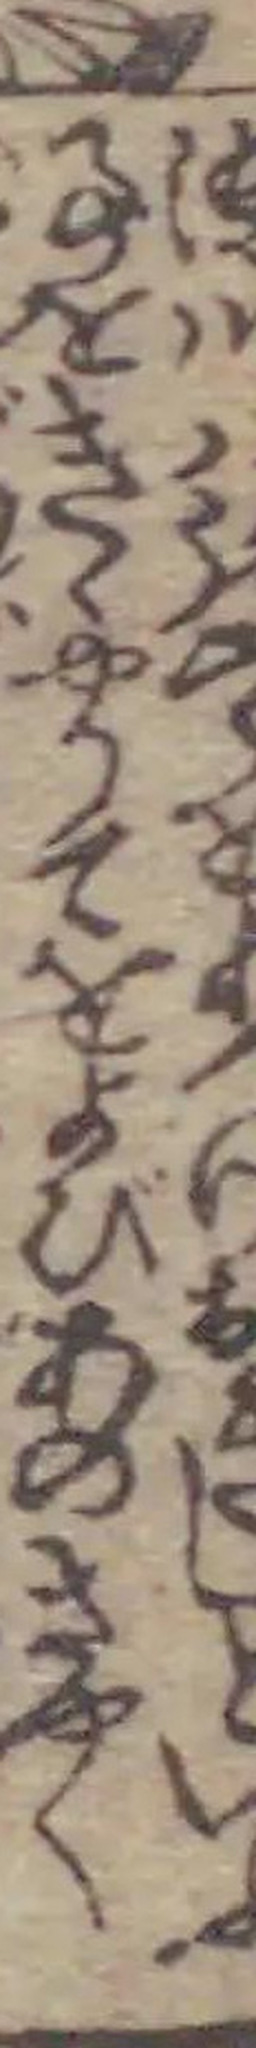事をきゝやりてをよびあのきやく
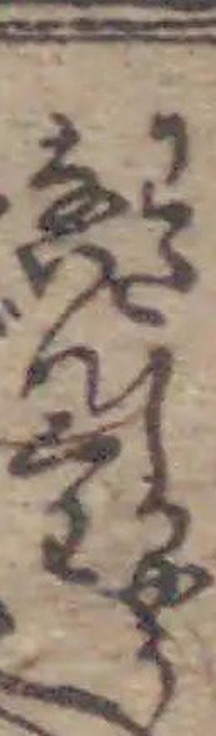ないんくわ
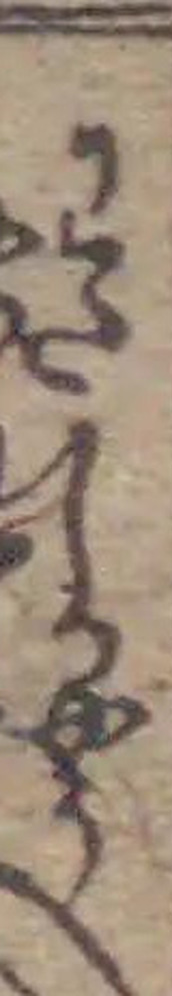わたしかやう
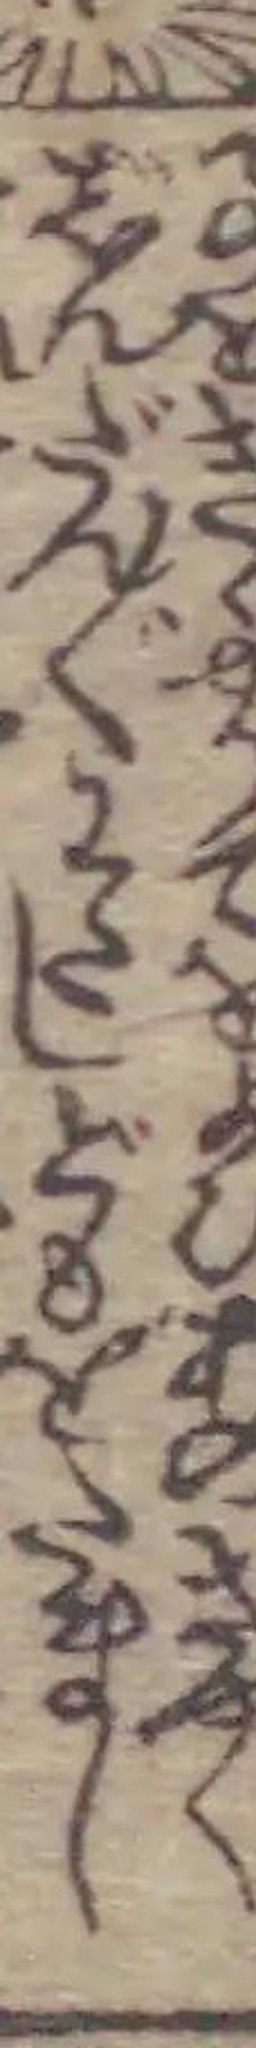しんだん〳〵わたしどもをたまし
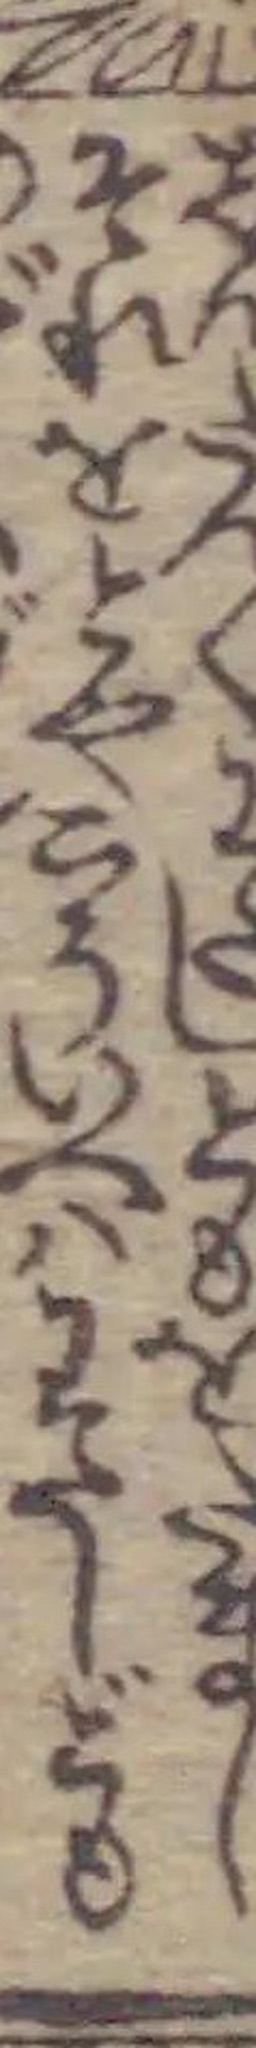それをとやこういへはわたしども
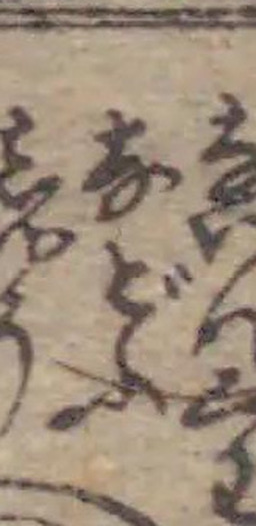しやう
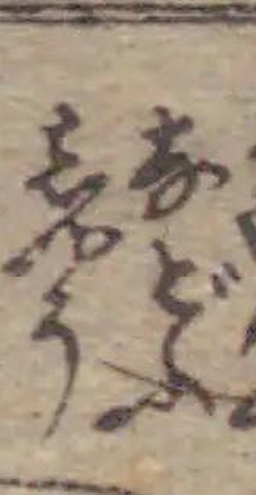しやう
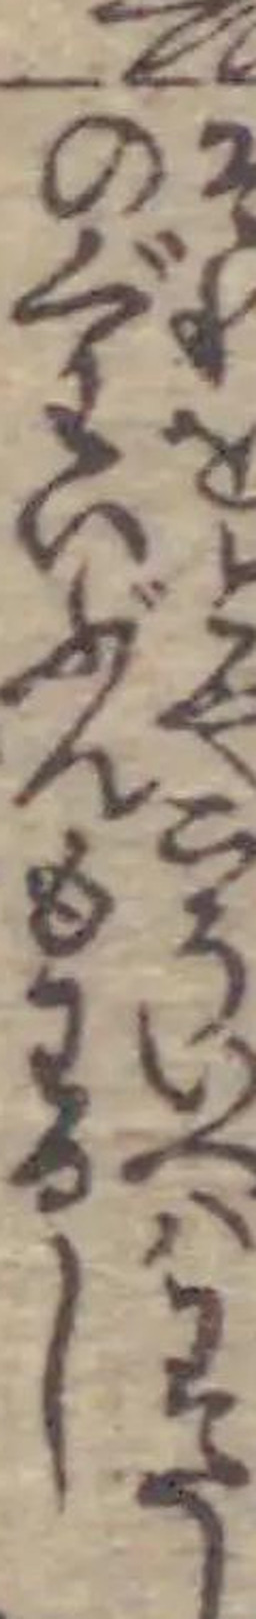のぐわいぶんもわるし
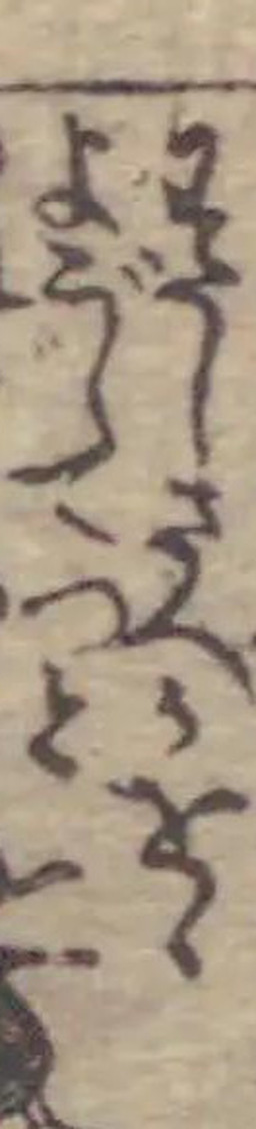よごしてつと
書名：虚言弥二郎傾城誠 3巻
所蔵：国立国会図書館 National Diet Library, JAPAN
